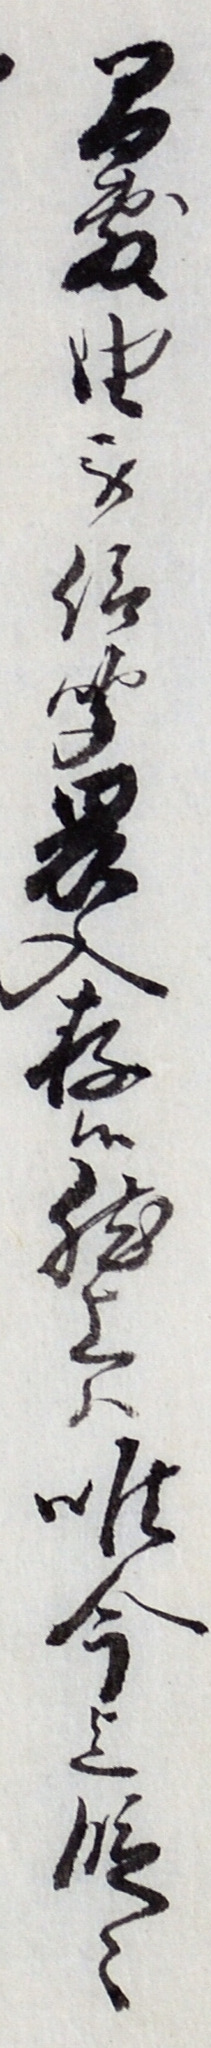間敷由被仰聞畏入存候然上ハ唯今迄段々
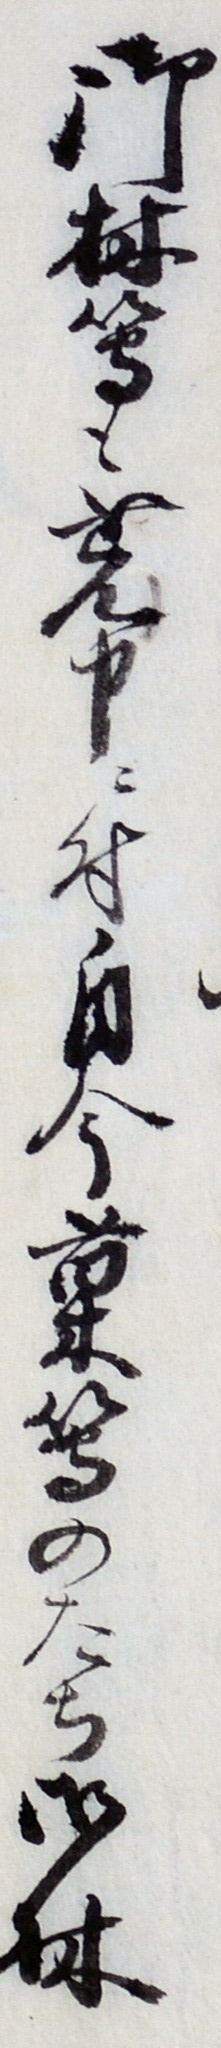御林等も荒申ニ付自今苗木等のたち御林
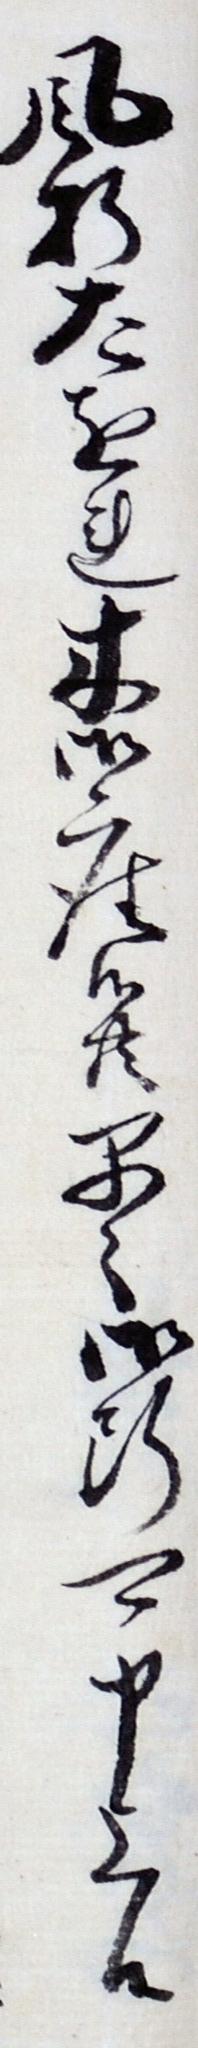風折たをれ木御座候共早々御断可申上候
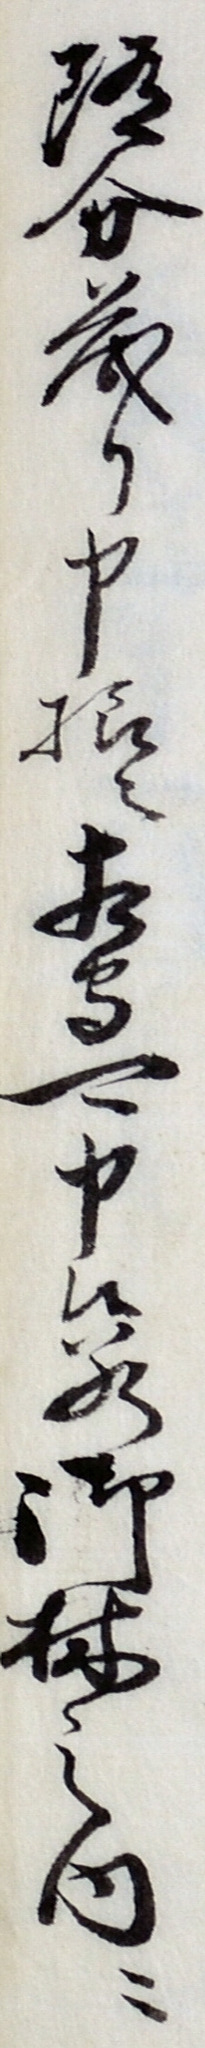随分茂り申様ニ相守可申候若御林之内ニ
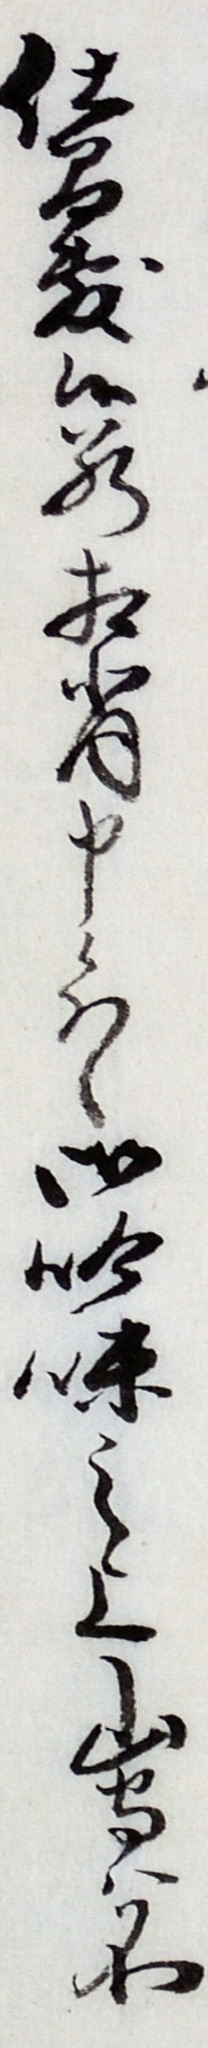仕間敷候若相背申候ハヽ御吟味之上山守ハ不
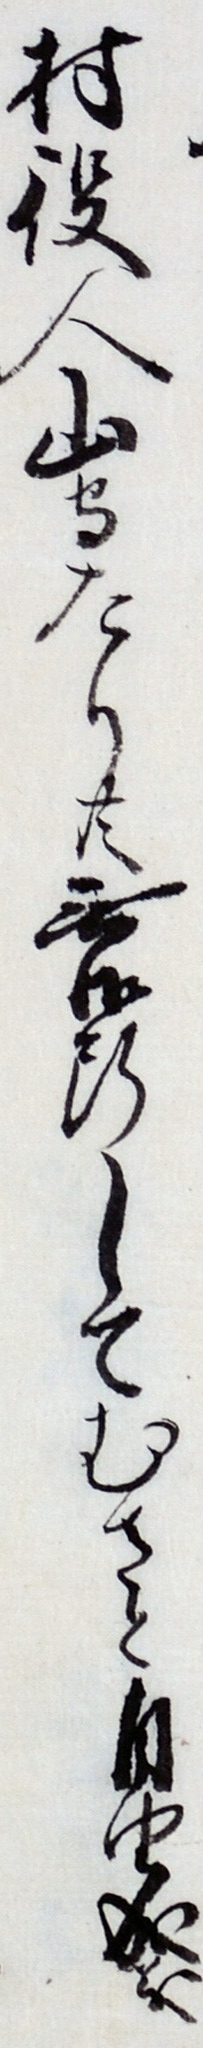村役人山守たり共無御断してむさと自由成義
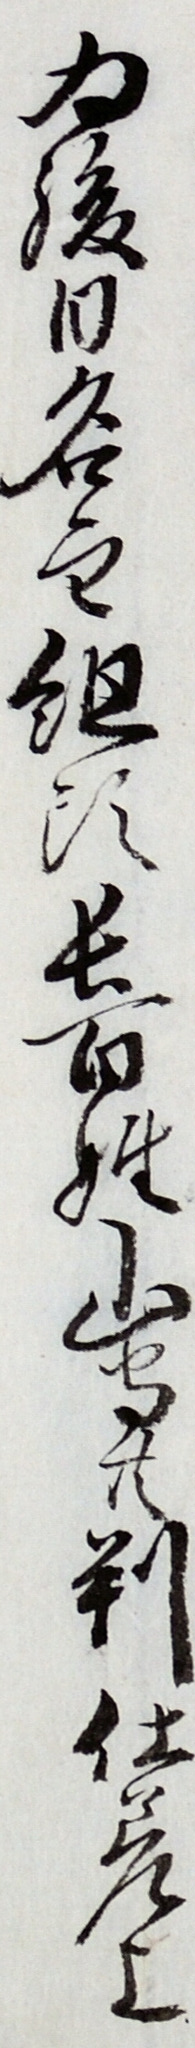為後日名主組頭長百姓山守共判仕差上
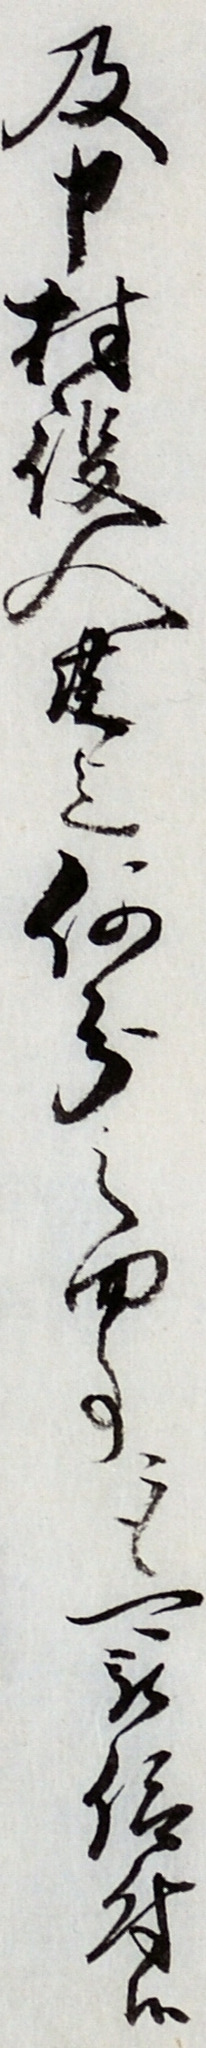及申村役人共迄何分之曲事ニも可被仰付候
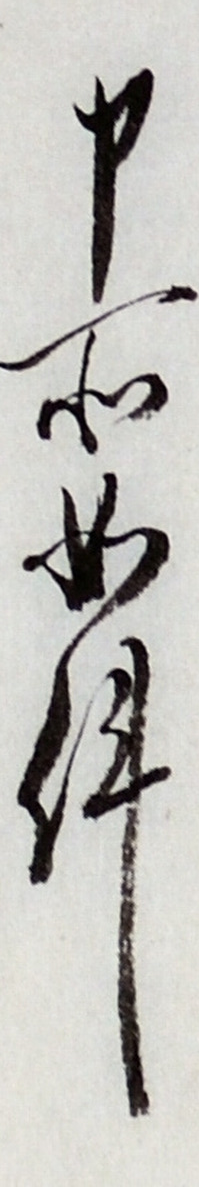申所如件
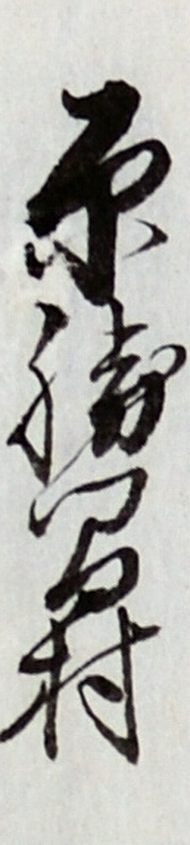原勝間村
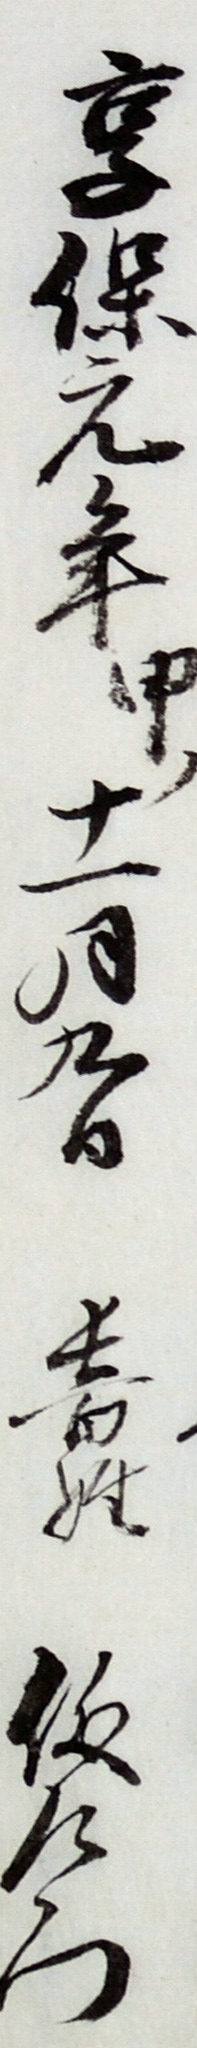享保元年申ノ十一月九日長百姓儀左衛門
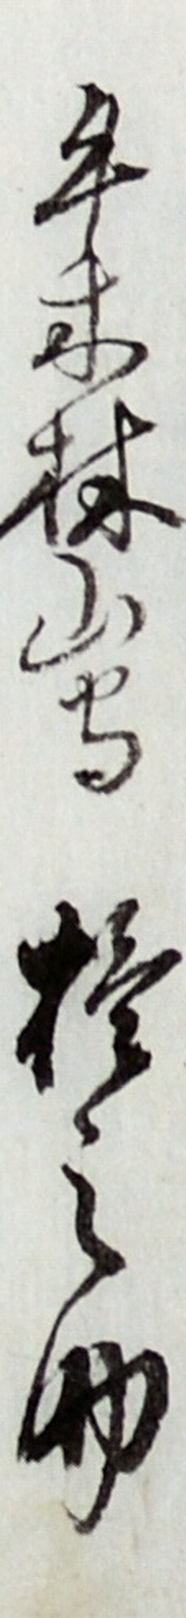牛木林山守権之助

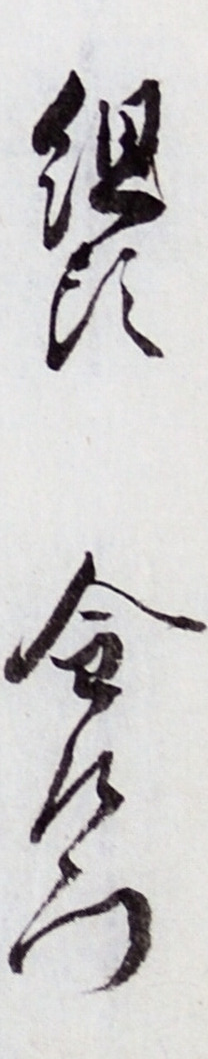組頭金左衛門
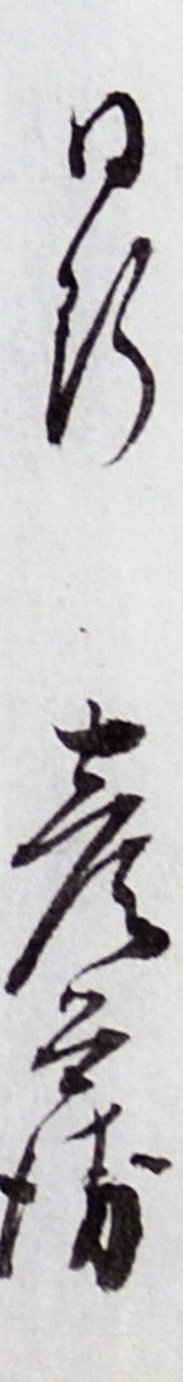同断彦兵衛
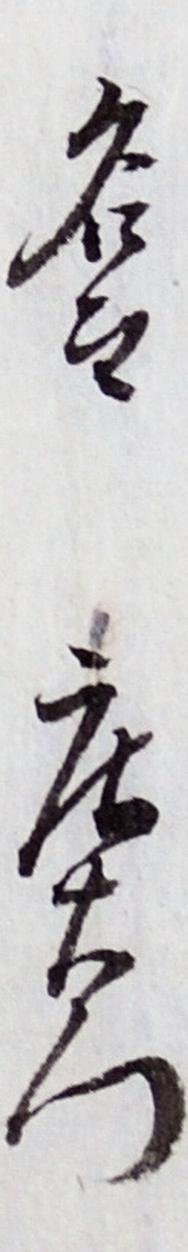名主庄右衛門
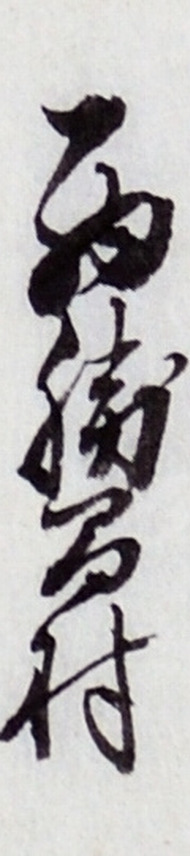西勝間村
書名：御林御竹藪証文控
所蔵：伊那市立高遠町図書館・合同会社AMANE
